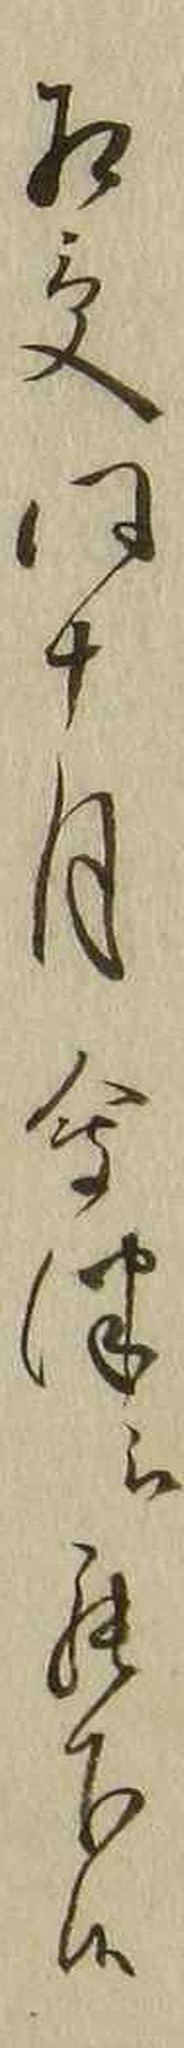拝受同十月会津江罷下候
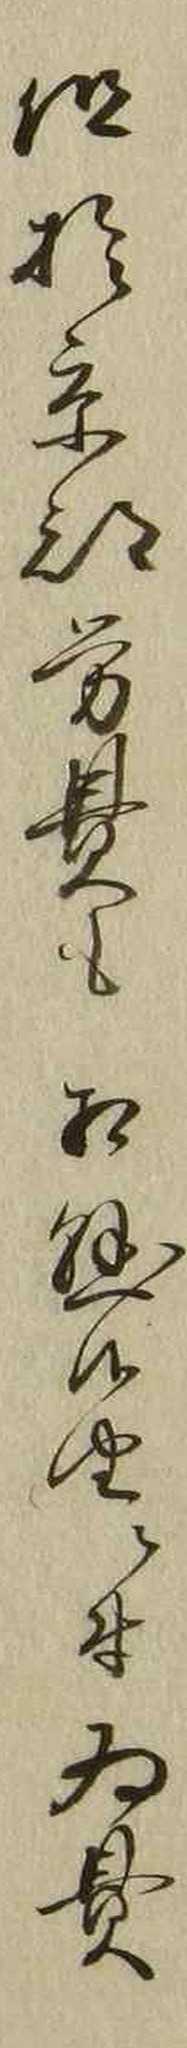但於京都労費も相懸候由ニ付為費
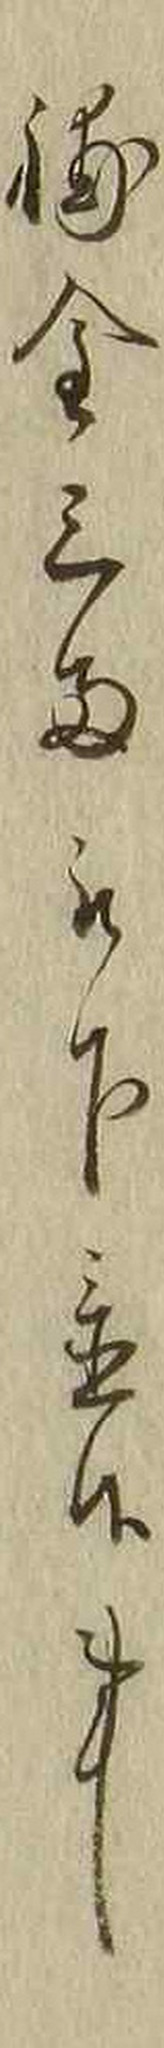補金三両被下置候事
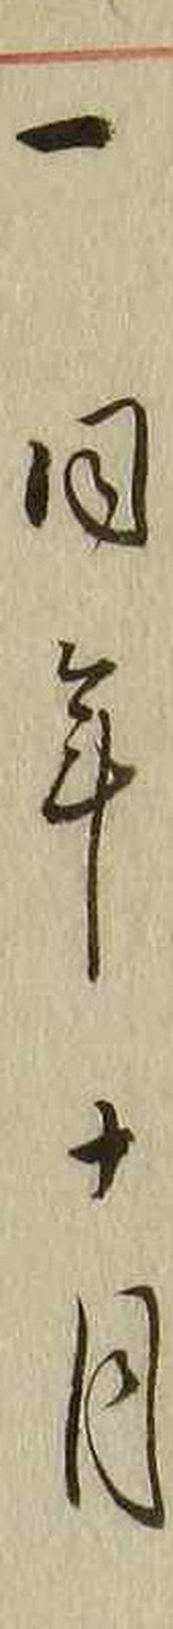一同年十月
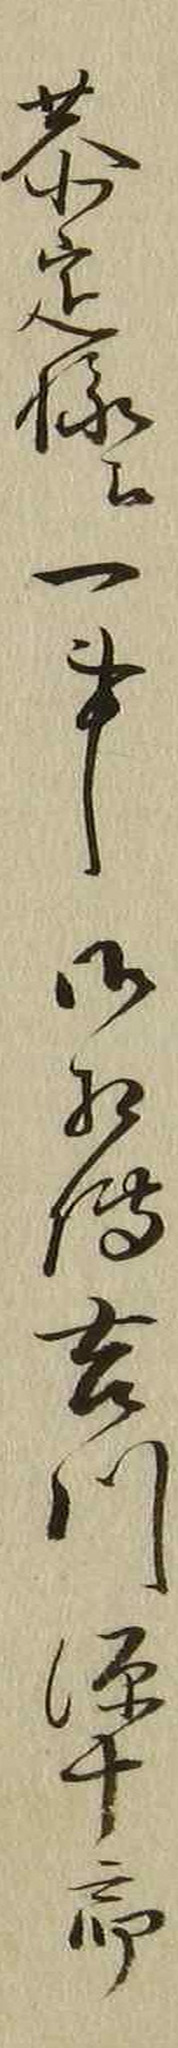恭定様江一事御相伝吉川源十郎
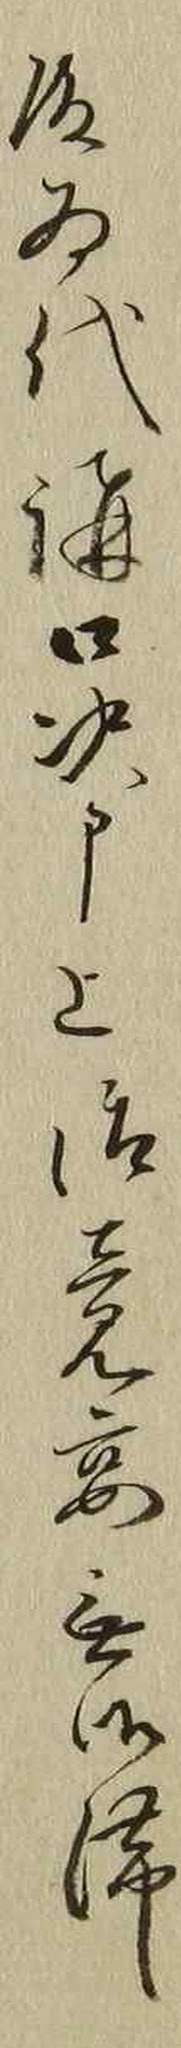殿為代講口決申上御竟宴無御滞
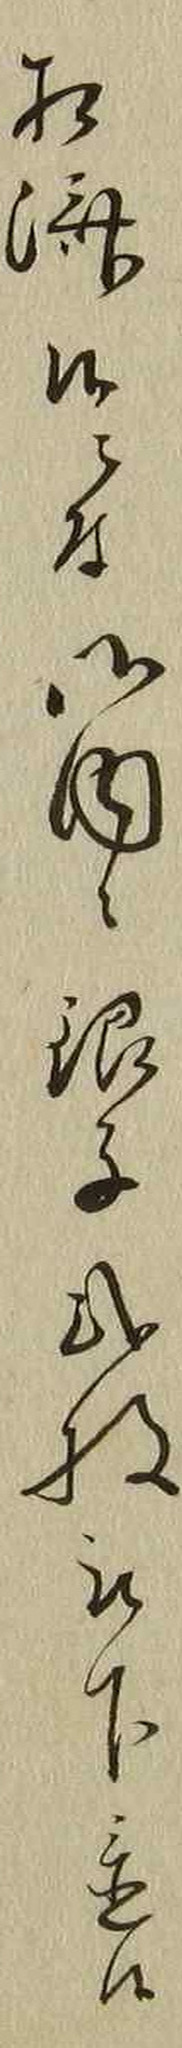相済候ニ付御内々銀子弐枚被下置候
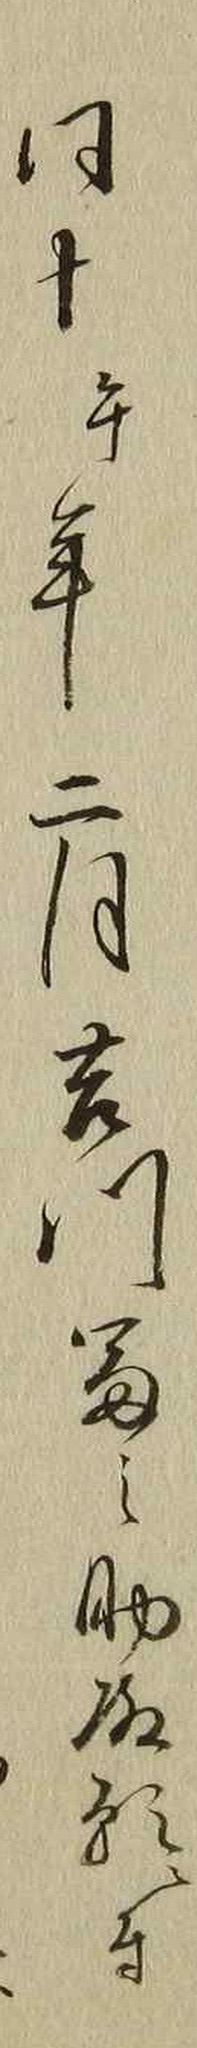一同十午年二月吉川富之助殿願ニ付
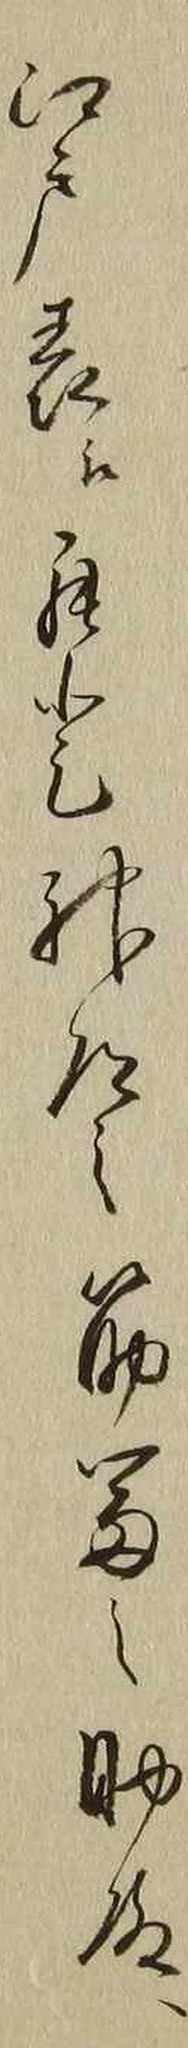江戸表江罷登神道之筋富之助殿ヘ
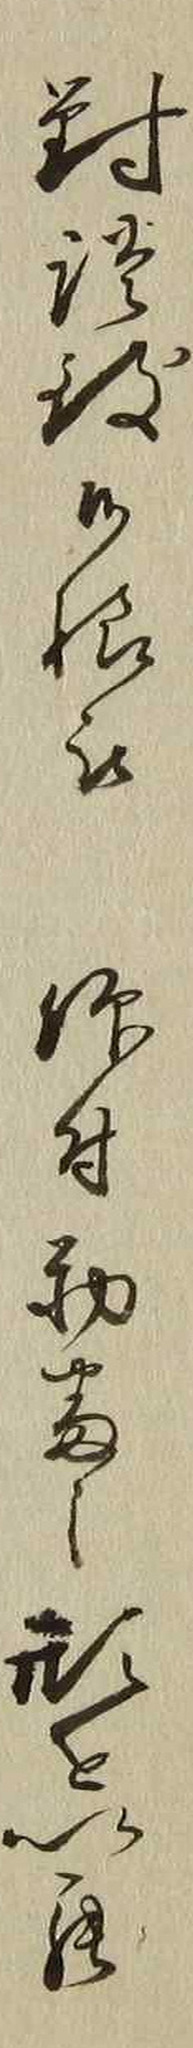対談致候様被仰付勤番之形を以罷
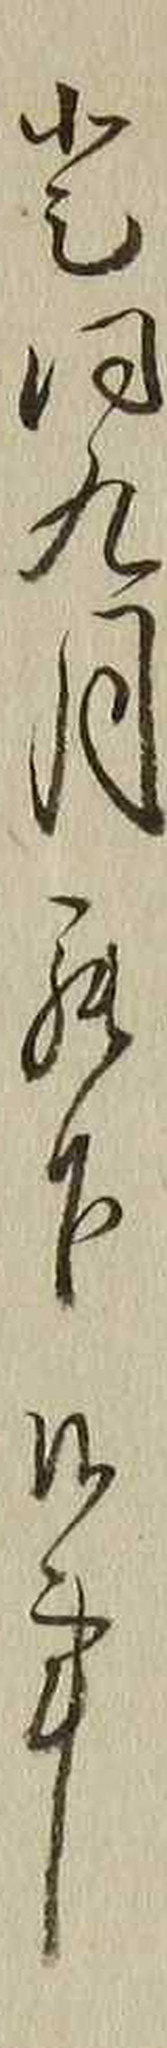登同九月罷下候事
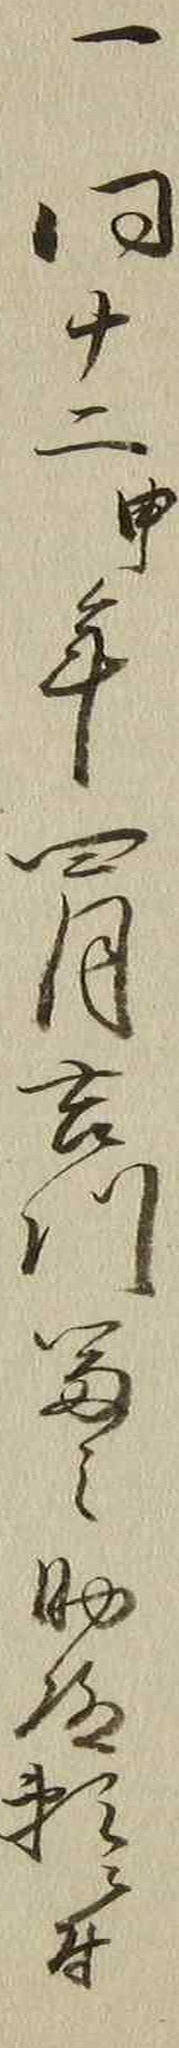一同十二申年四月吉川富之助殿頼ニ付
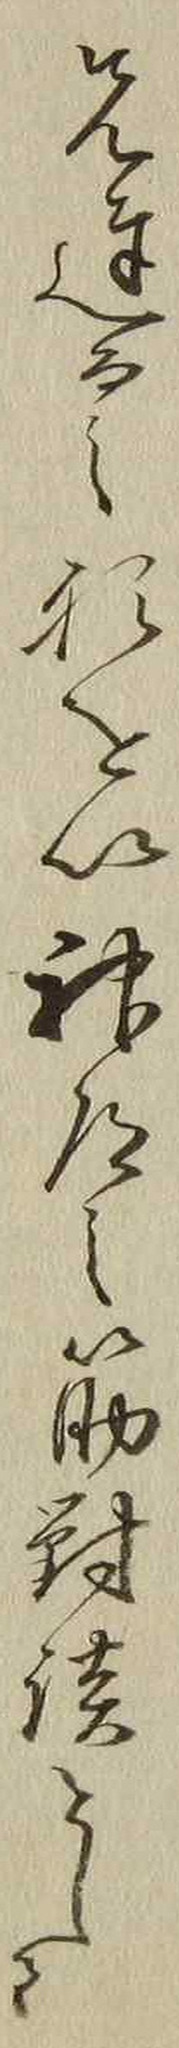先達而之形を以神道之筋対談として
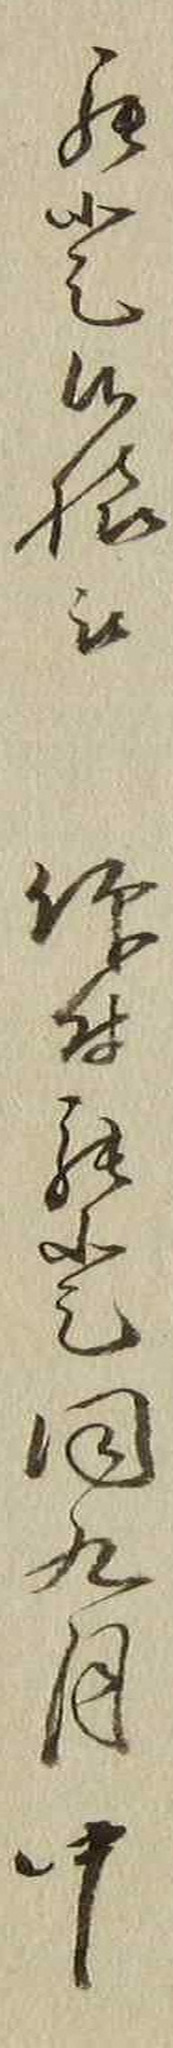罷登候様被仰付罷登同九月中
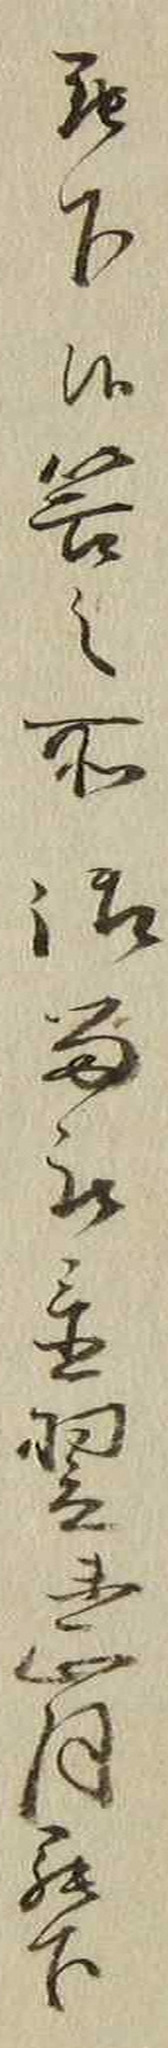罷下候筈之所御留被置翌未正月罷下
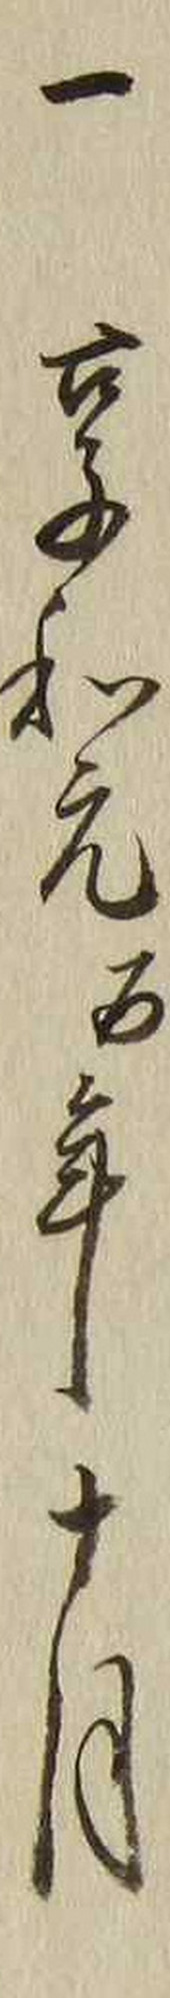一享和元酉年十月
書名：諸士系譜　巻之68　を之部2
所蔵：会津若松市立会津図書館
